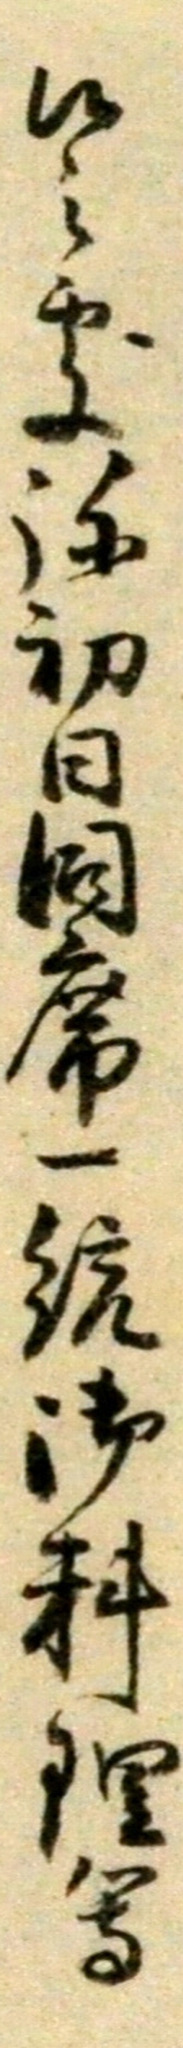候之處弥初日同席一統御料理等
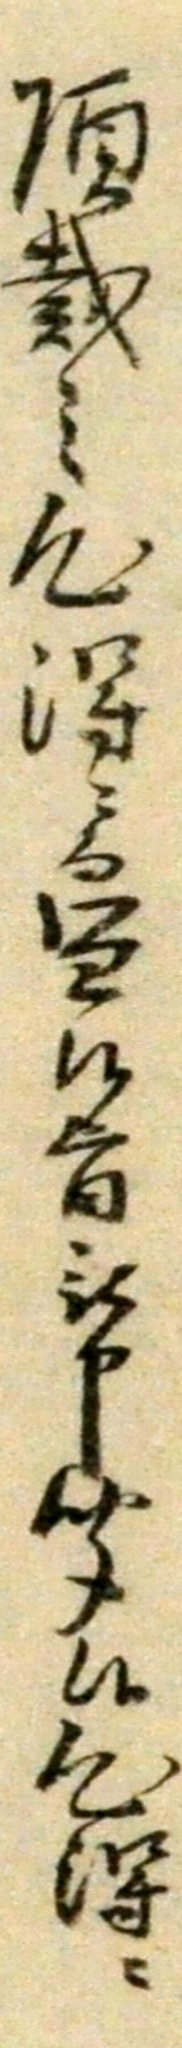頂戴之心得ニ而宜候旨被申聞候心得ニ
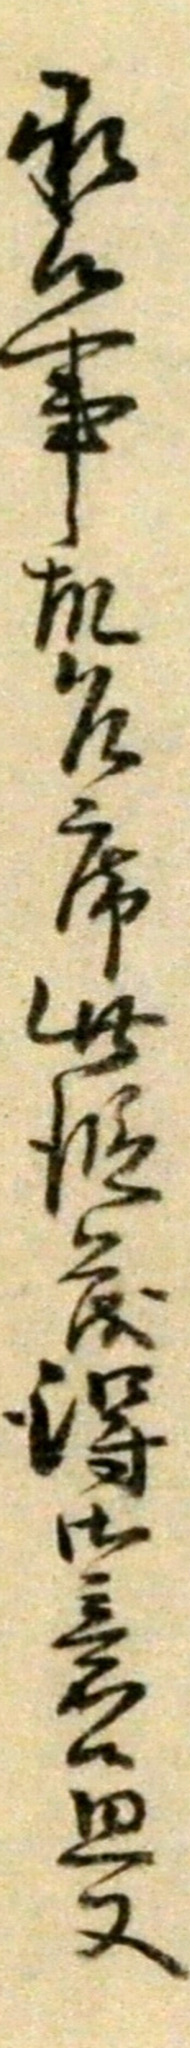承候事故乍序此段も得御意候且又
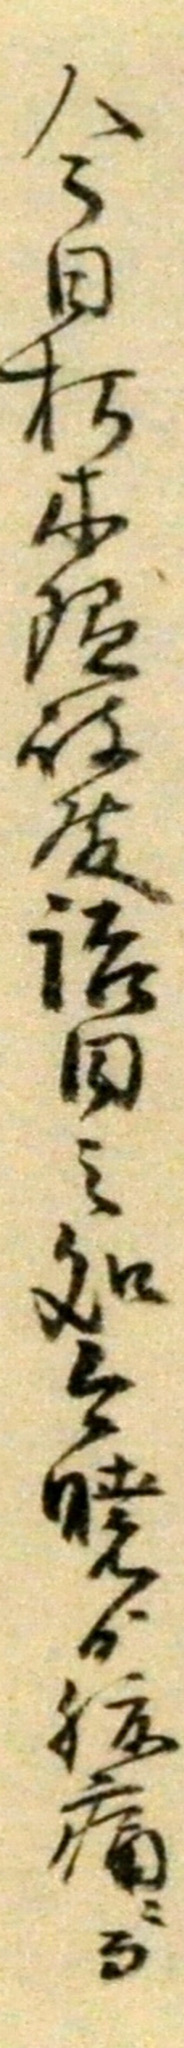今日朽木隠岐殿詰日之処今暁ゟ腹痛ニ而
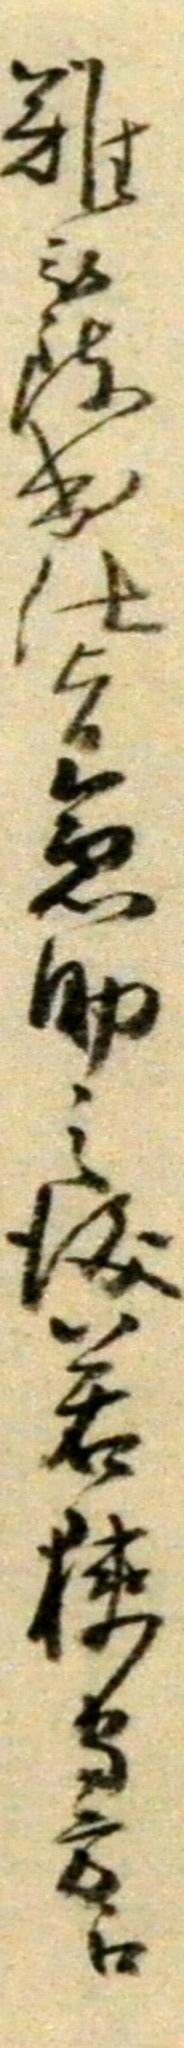難被致出仕旨急助之儀若狭守方え
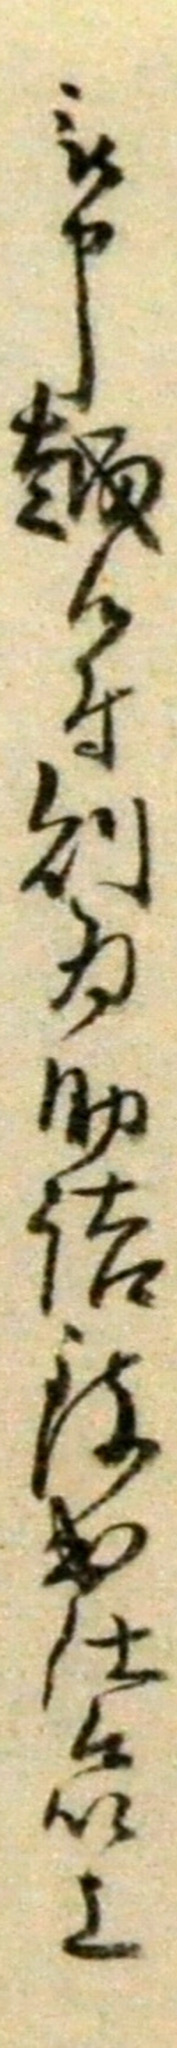被申越候付則為助詰致出仕候以上

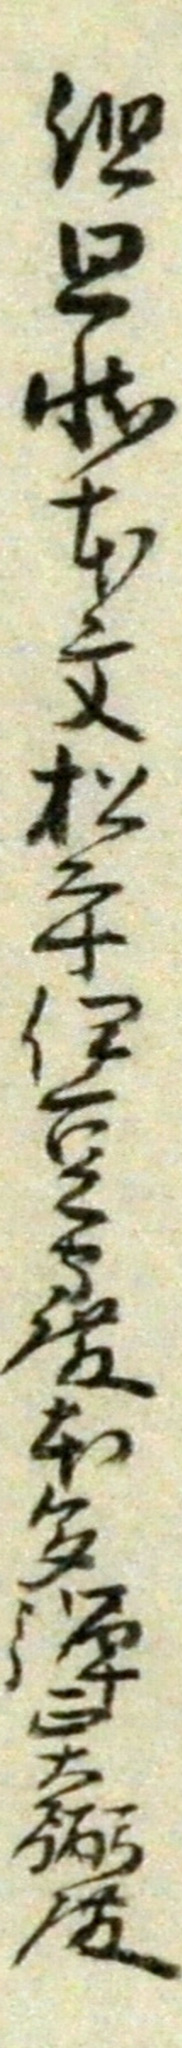但廻状本文松平伊豆守殿本多弾正大弼殿
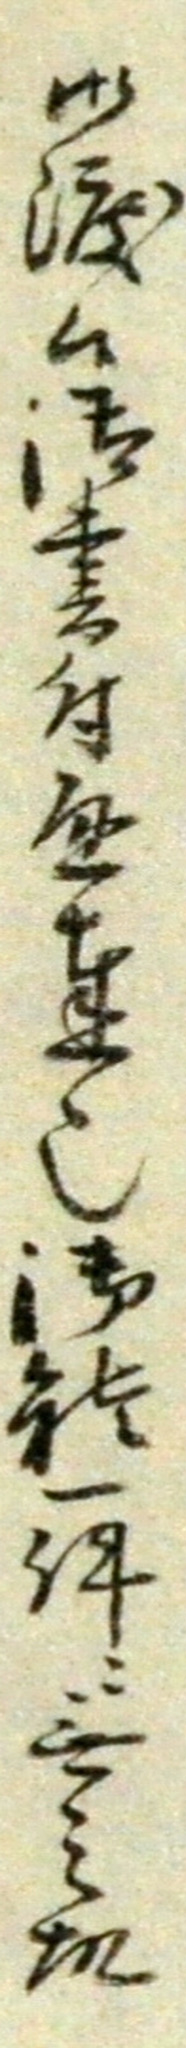御渡候御書付通達也御能一件ニ無之故
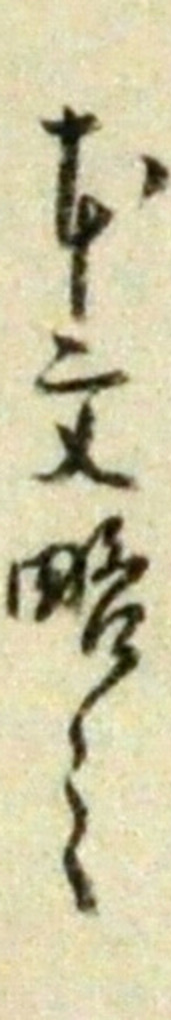本文略候
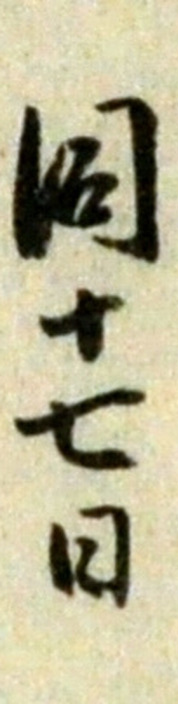同十七日
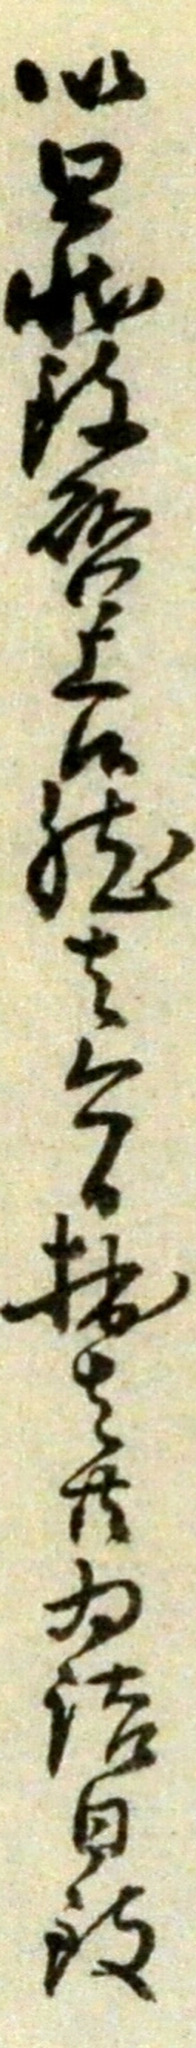以廻状致啓上候然は今日拙者共為詰日ノ致
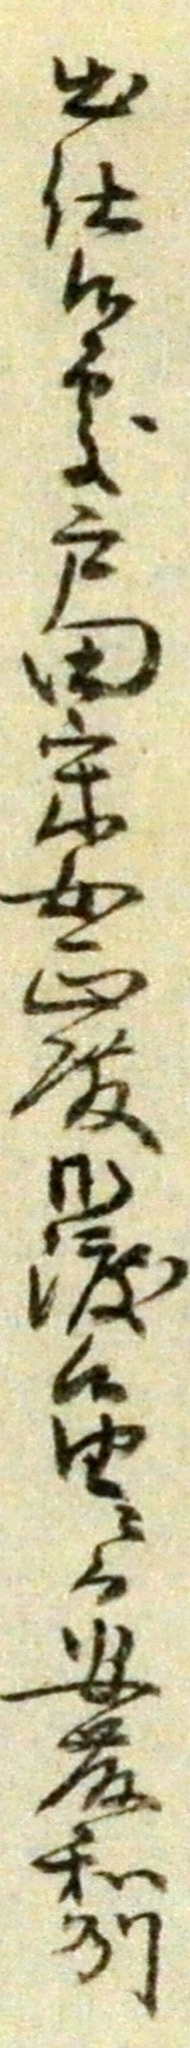出仕候處戸田采女正殿御渡候由ニ而安藤和州
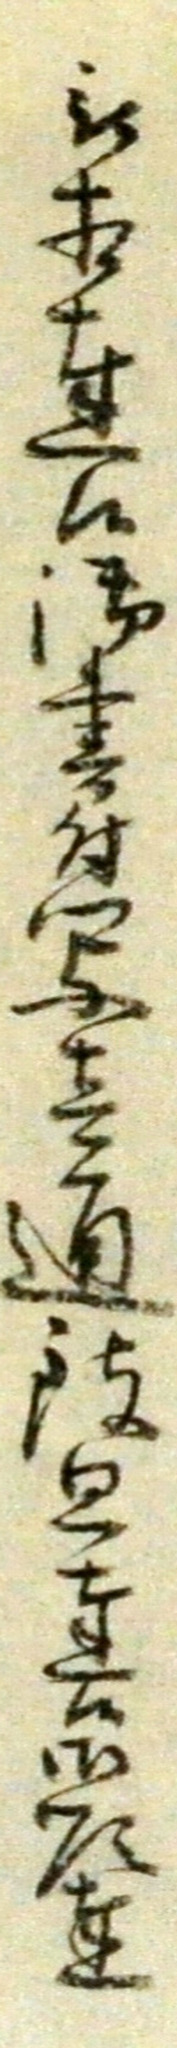被相達候御書付写壱通致廻達候御順達
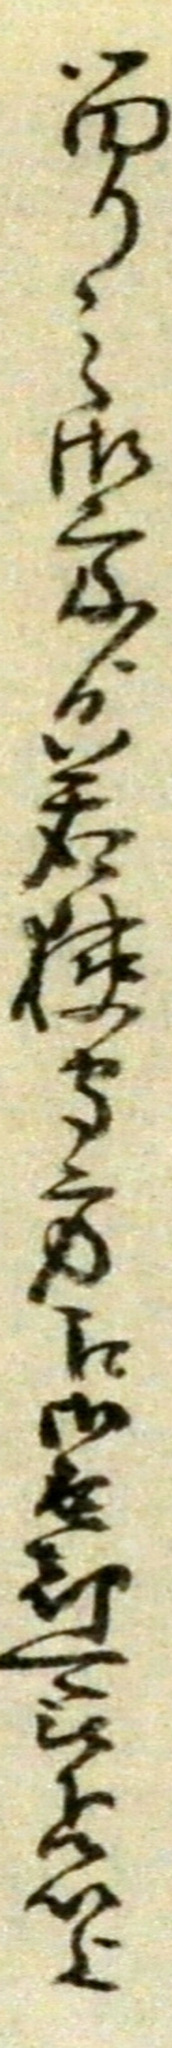留り之御方ゟ若狭守方え御返却可被下候以上
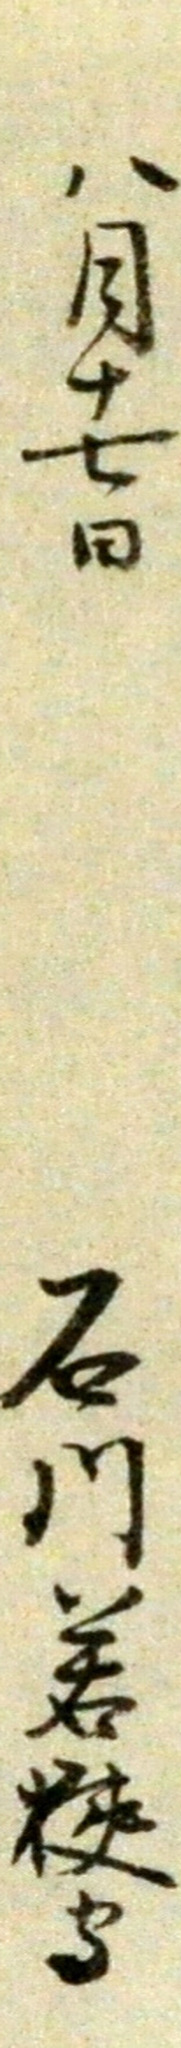八月十七日石川若狭守
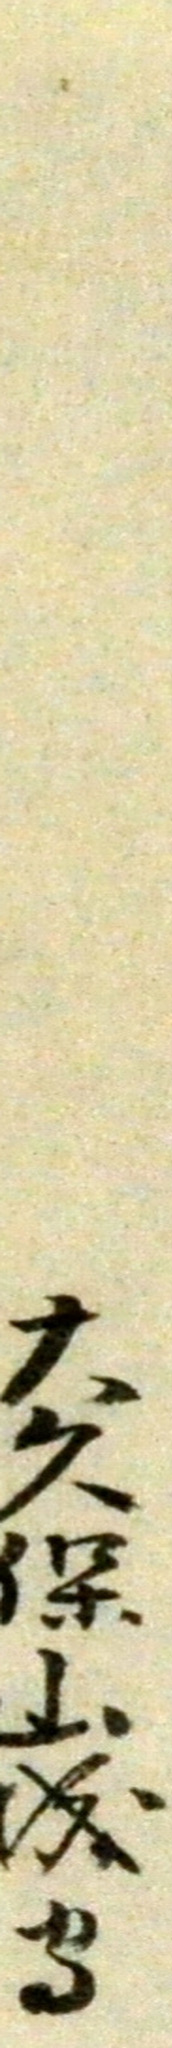大久保山城守
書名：若君様（家斉嫡男）誕生諸祝儀ノ節ノ留書外
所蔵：伊那市立高遠町図書館・合同会社AMANE
